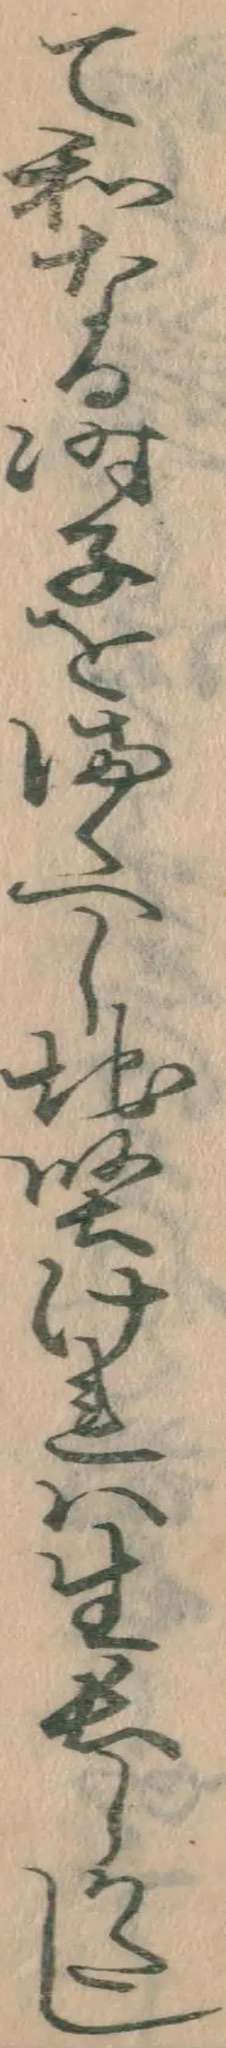て和なる時子をまくへし地堅けれは生長しかたし
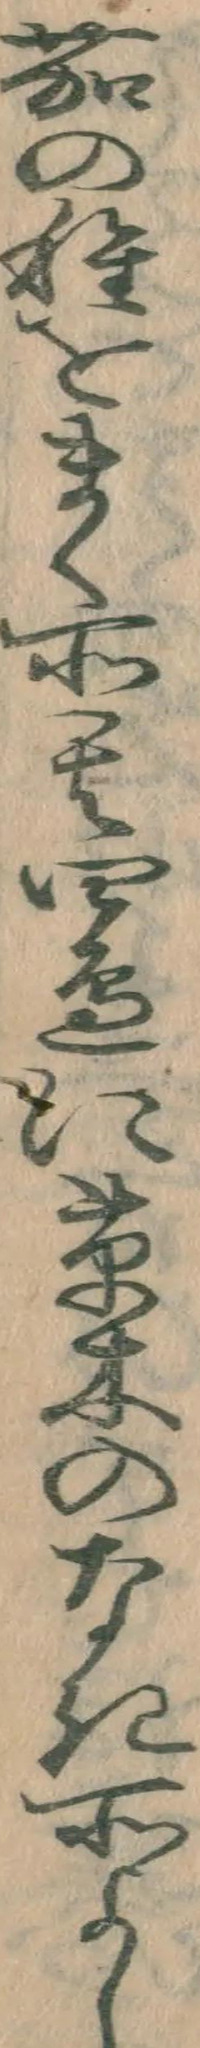茄の種をまく所其四辺に草木のなき所よし

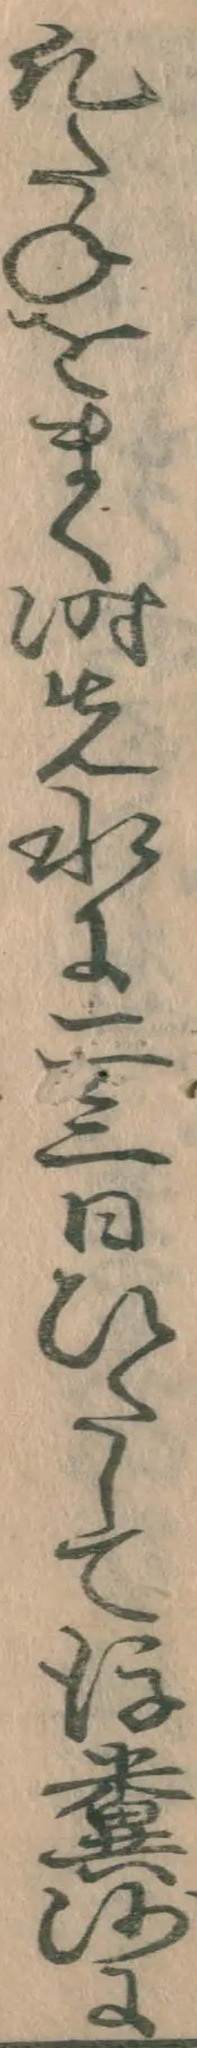凡たねをまく時先水に二三日ひたして後に糞沙に
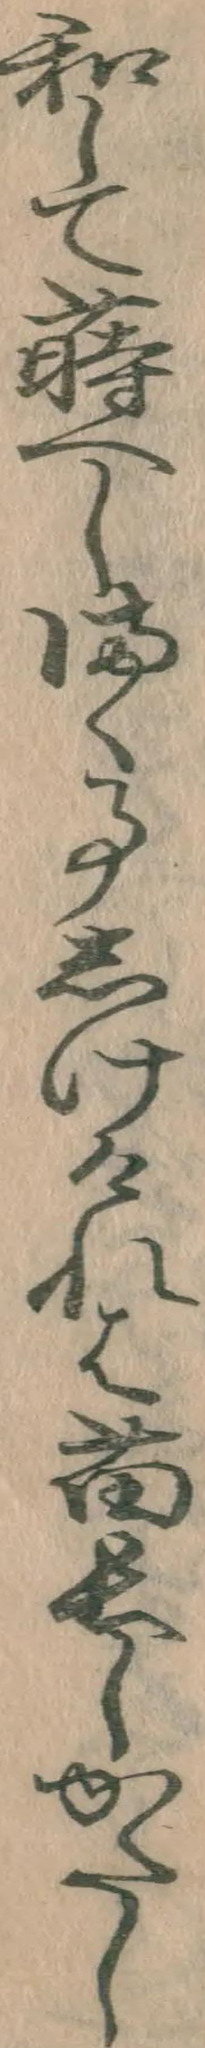和して蒔へしまく事しけけれは苗長しかたし
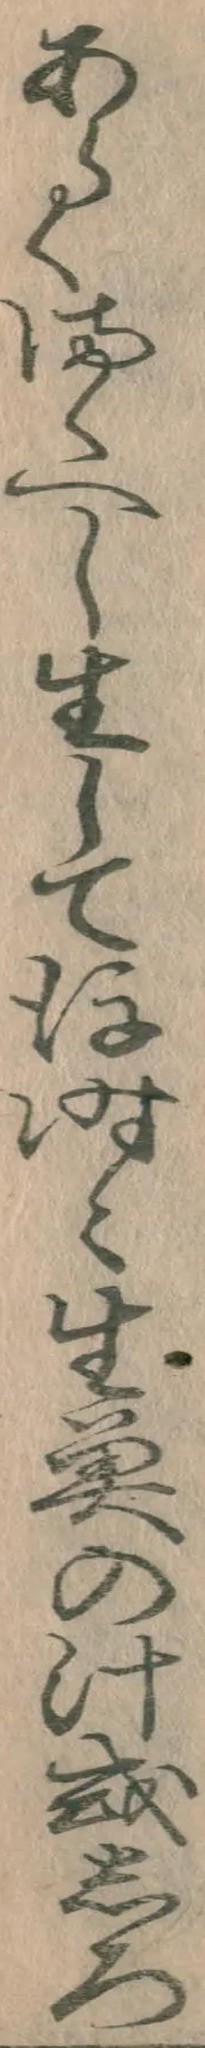あらくまくへし生して後時々生魚の汁或しろ
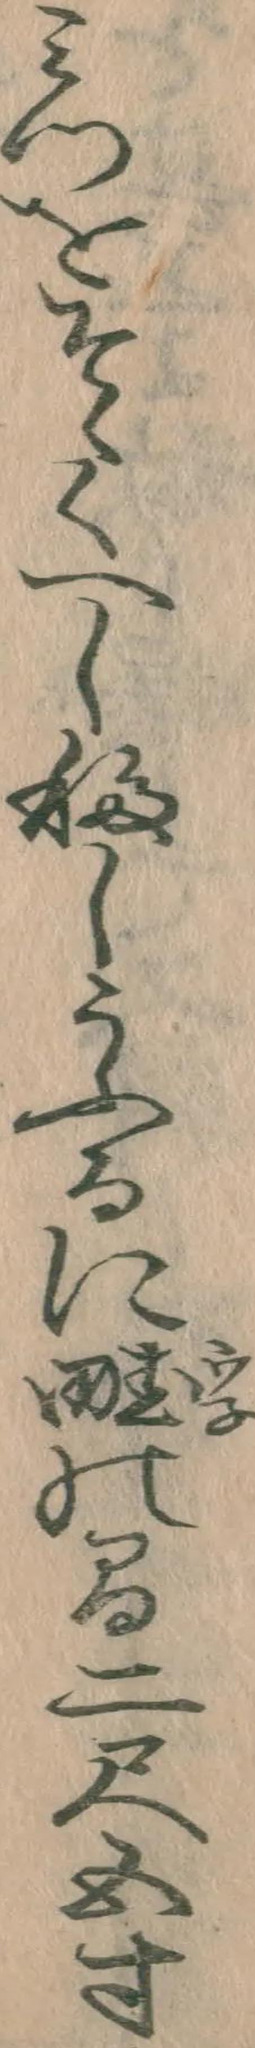みつをそゝくへし移しうふるに畦の間二尺五寸
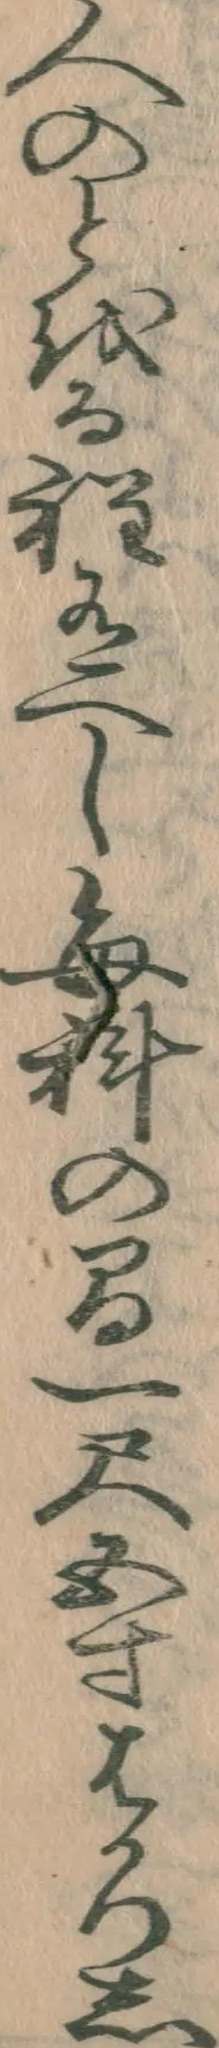人のとをる程有へし毎科の間一尺五寸はかりし
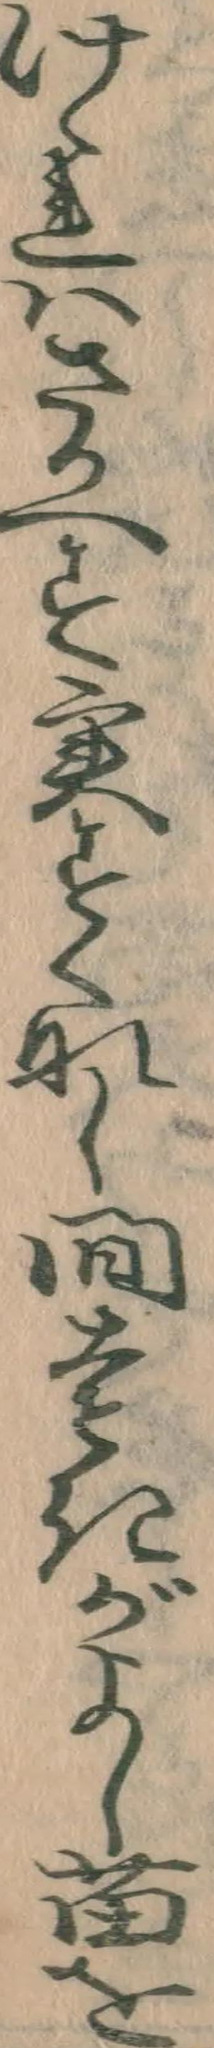けれはさかへす実すくなし間遠きがよし苗を
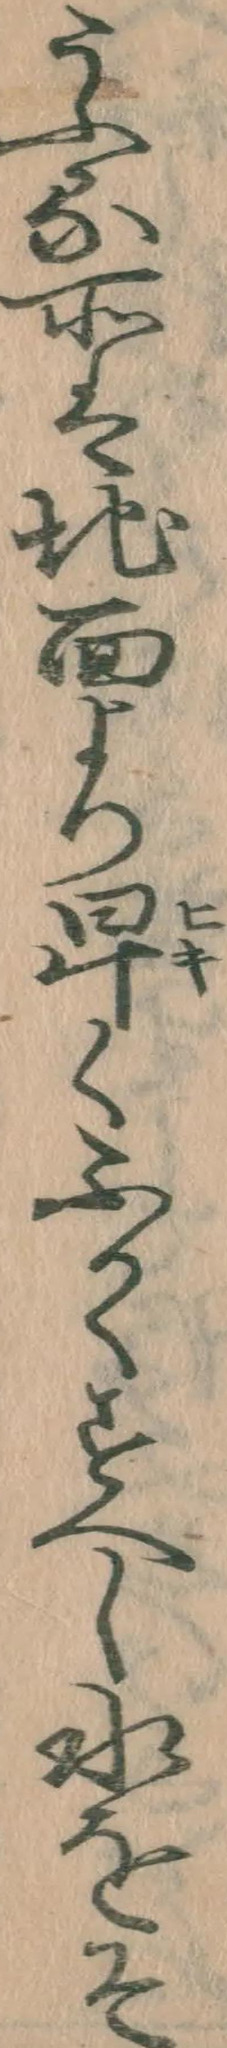うふる所は地面より卑くふかくすへし水をそ
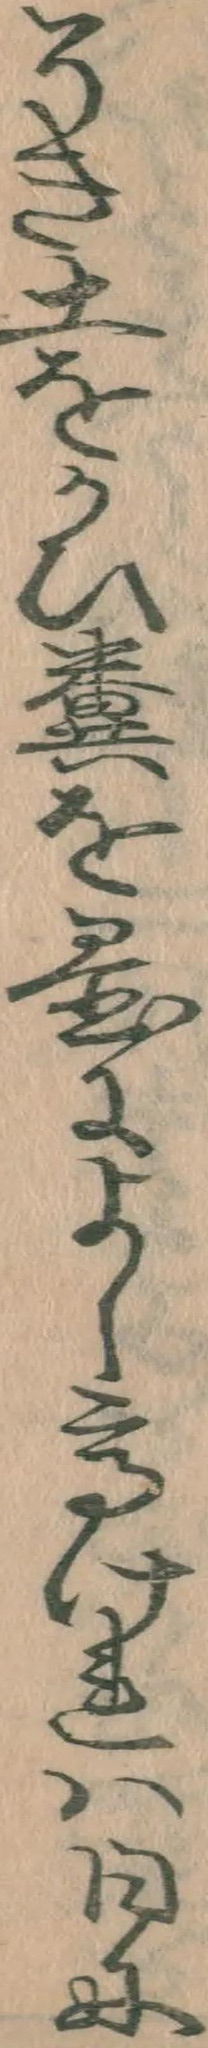そき土をかひ糞を置によし高けれは日に
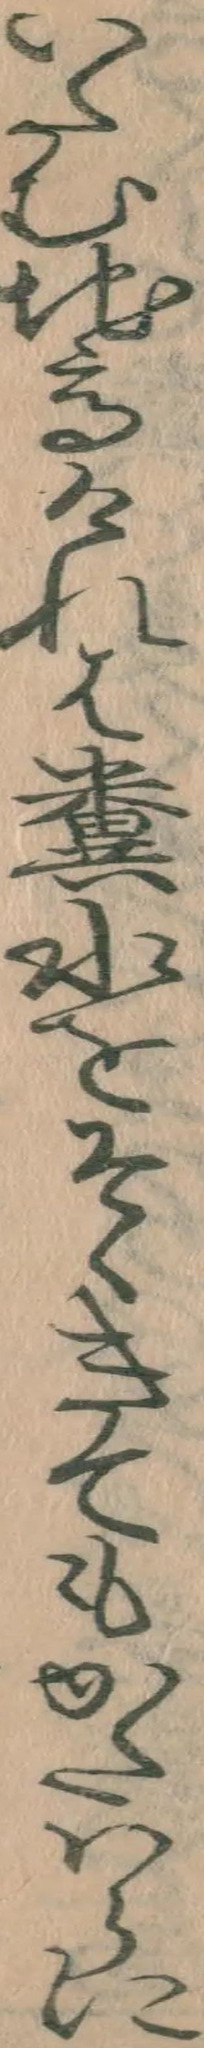いたむ地高けれは糞水をそゝきてもかたわらに
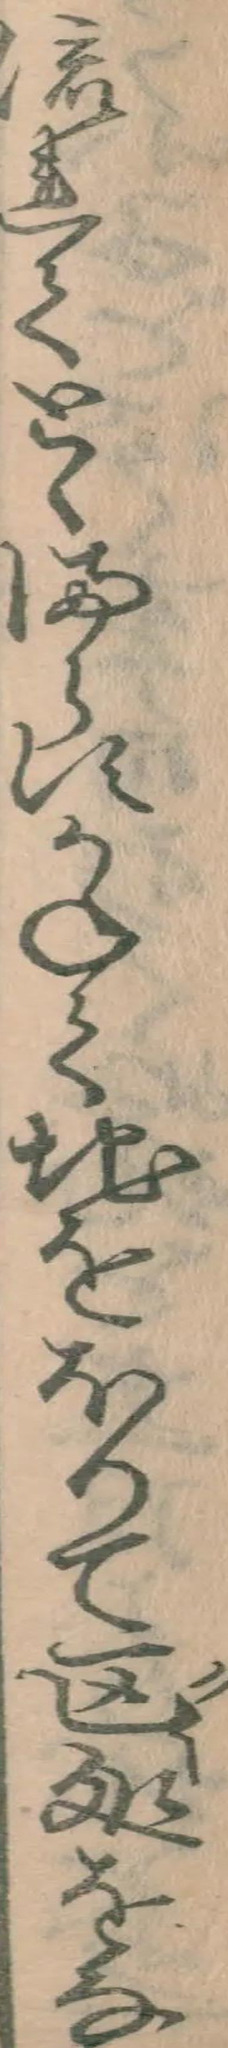流れてとゝまらすかねて地をほりて区処をな
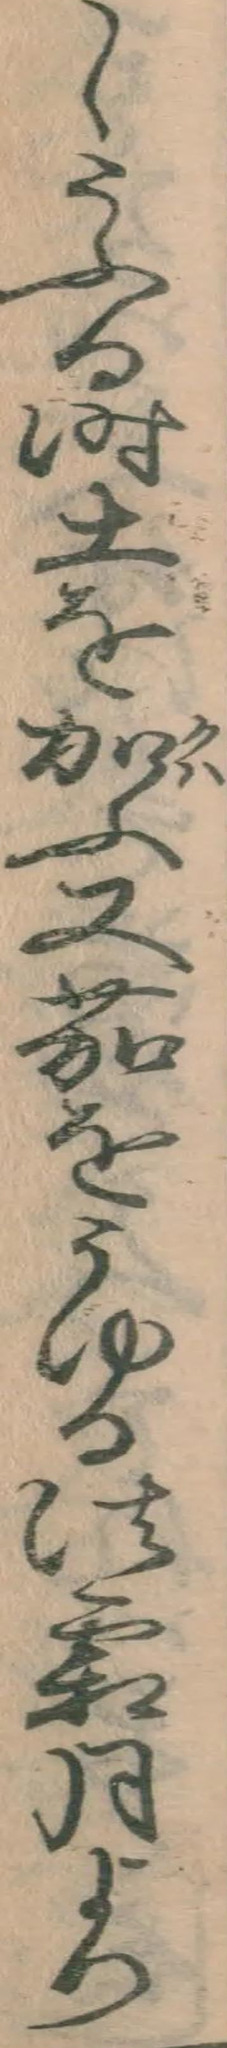しうふる時土を加ふ又茄をうゆる法霜月より
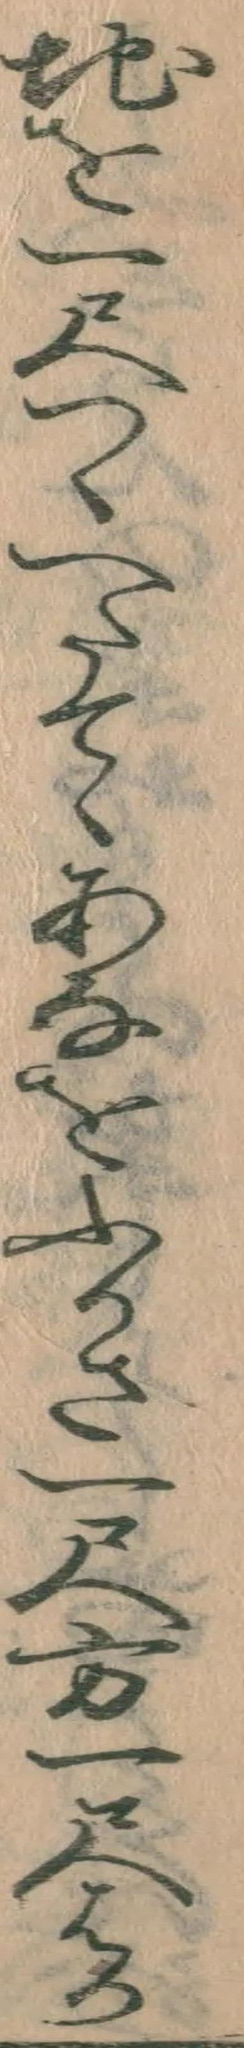地を一尺つゝへたてゝあなをふさ一尺方一尺はか
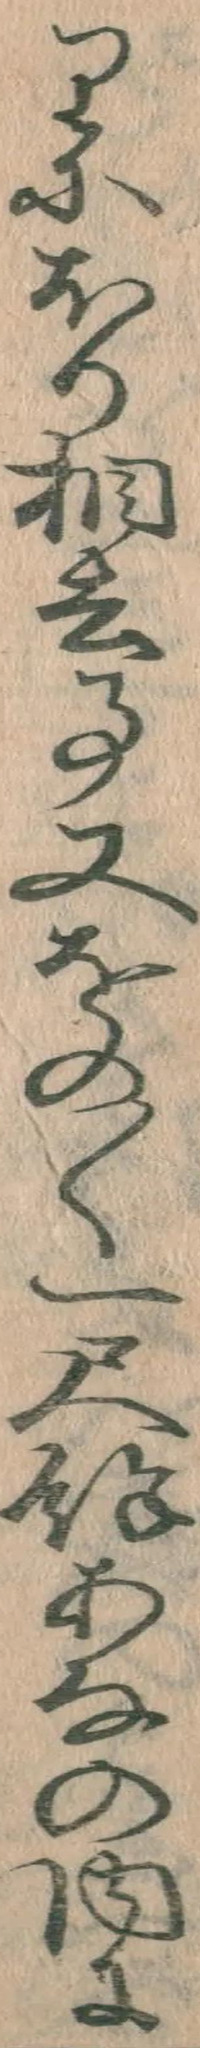りにほり相去事又をの〳〵一尺余あなの内に
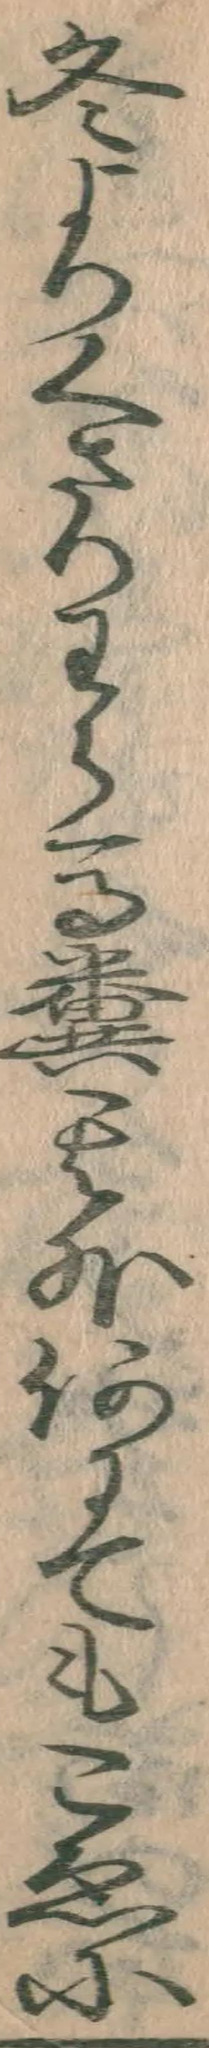冬よりくさりわら馬糞其外何にてもこゑに
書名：菜譜 3巻
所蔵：国立国会図書館 National Diet Library, JAPAN
